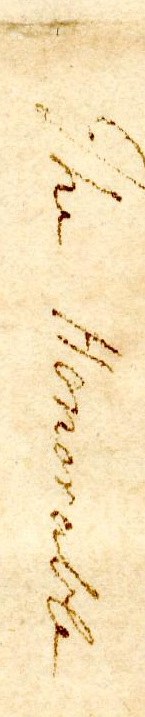The Honorable
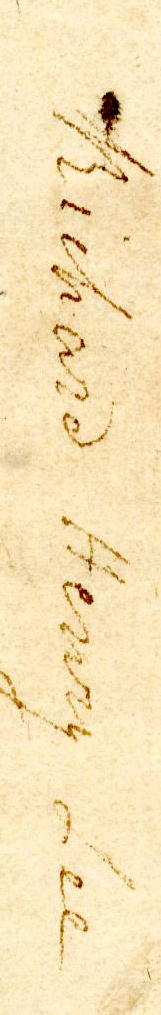Richard Henry Lee
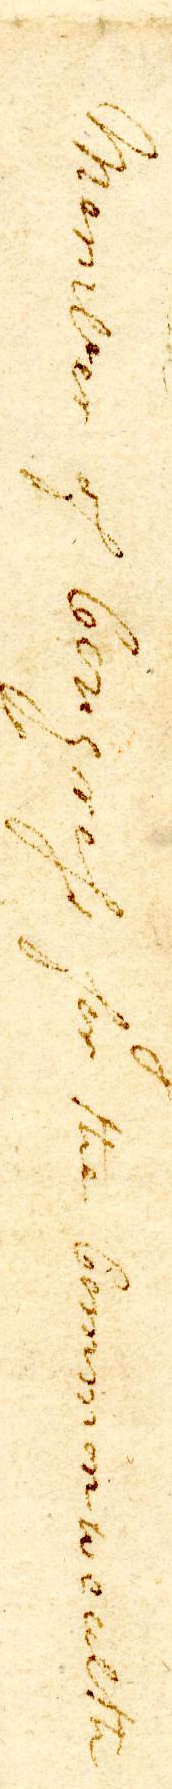Member of Congress for the Commonwealth
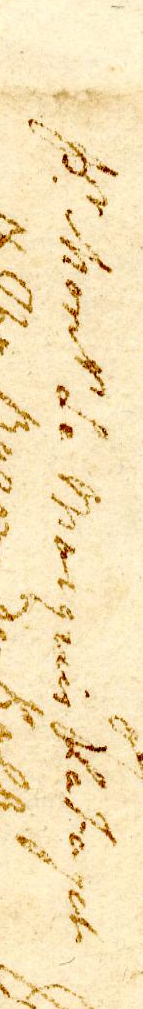p^r. Mons^r. Le Marquis La Fayet
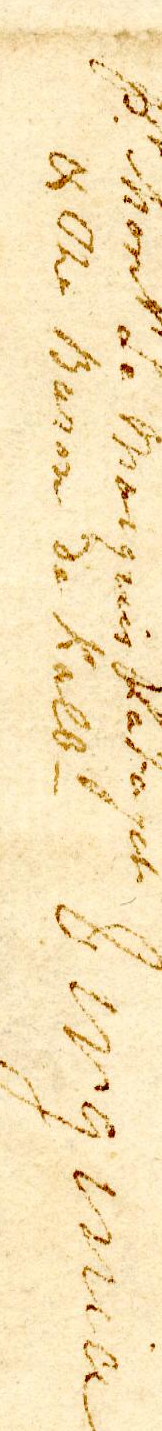& The Baron de Kalb Virginia
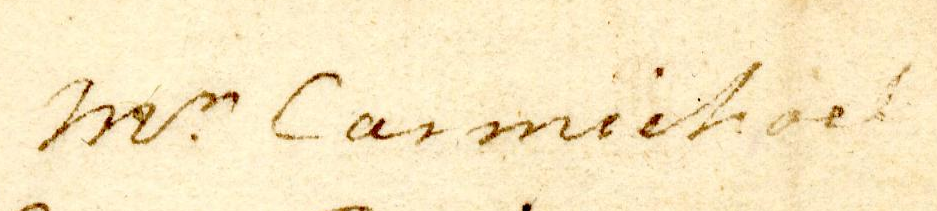M^r. Carmichael
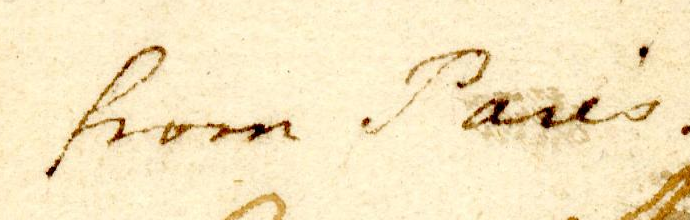from Paris
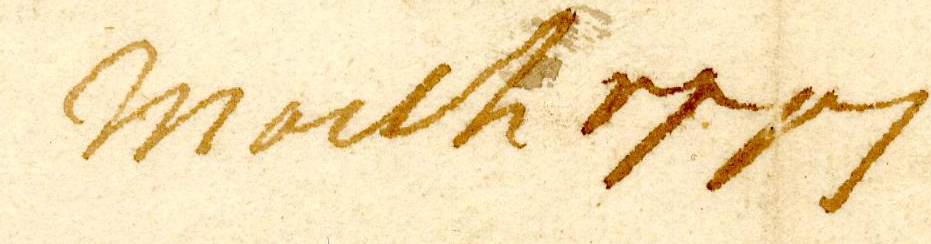March 1777
